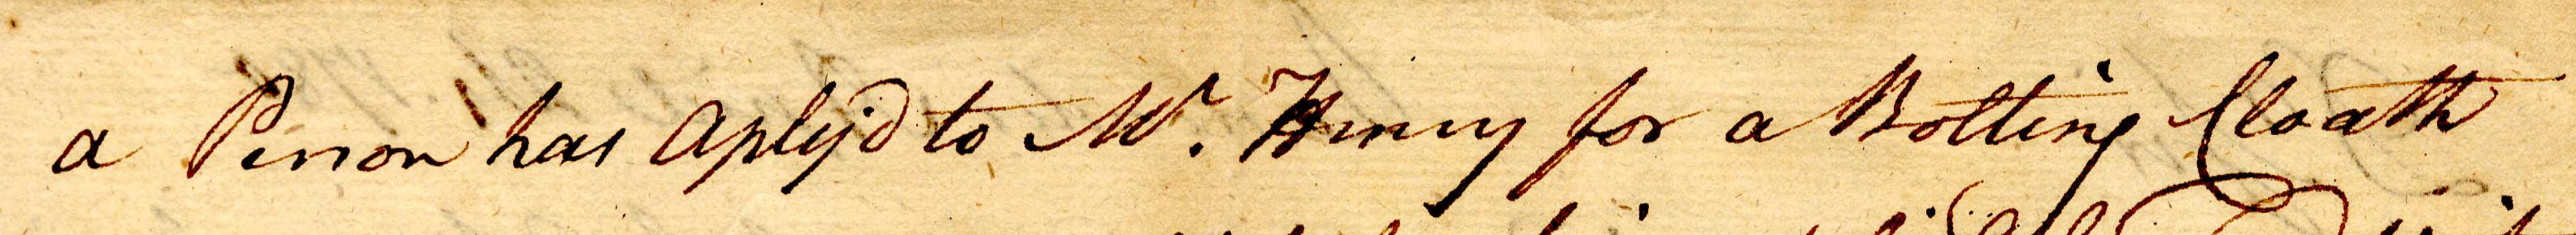a Person has aply'd to M^r. Henry for a Bolting Cloath
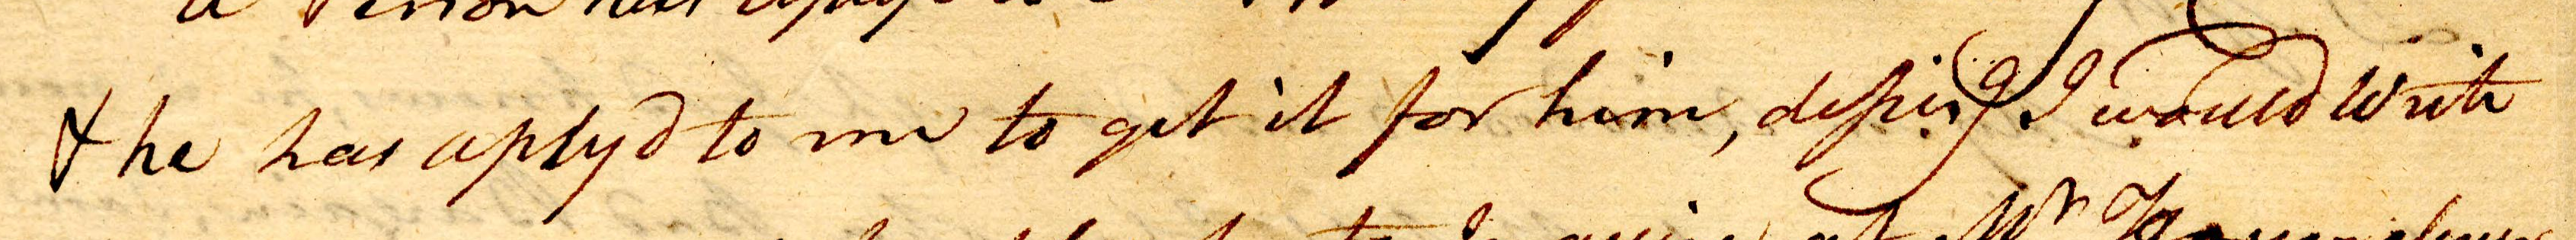& he has aplyd to me to get it for him, desiring I would write
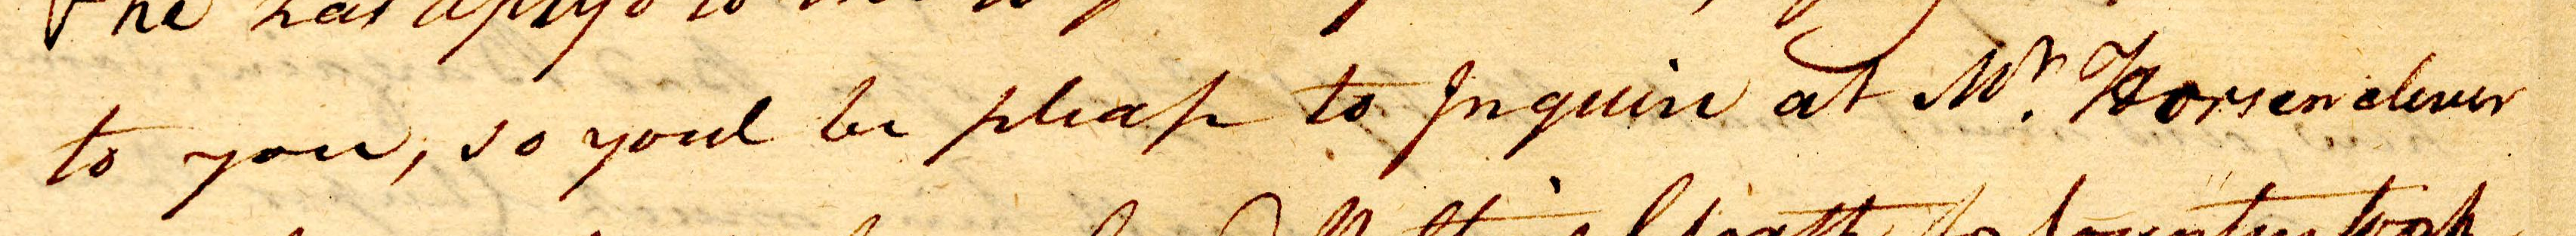to you, so youl be please to inquire at M^r. Horsenclever
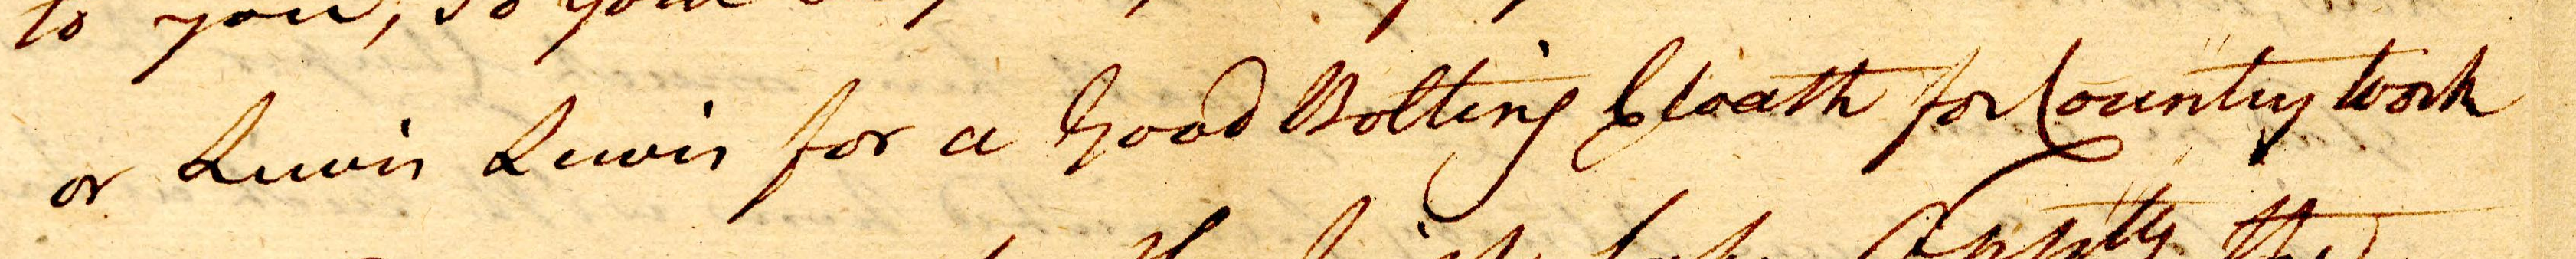or Lewis Lewis for a Good Bolting Cloath for Country work
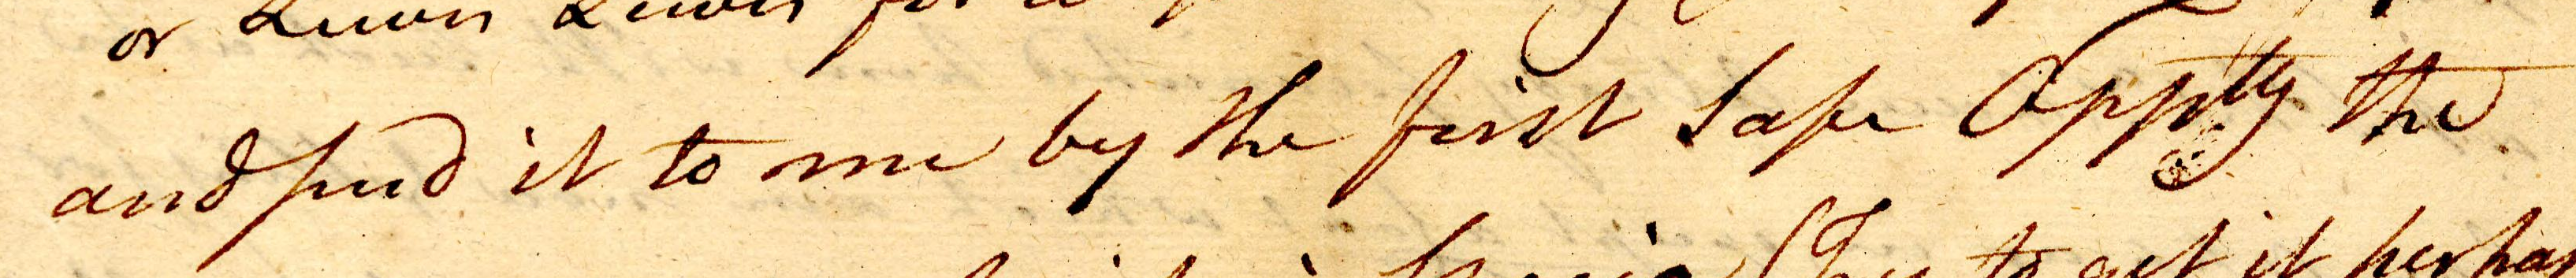and send it to me by the first Safe Opp^ty the.
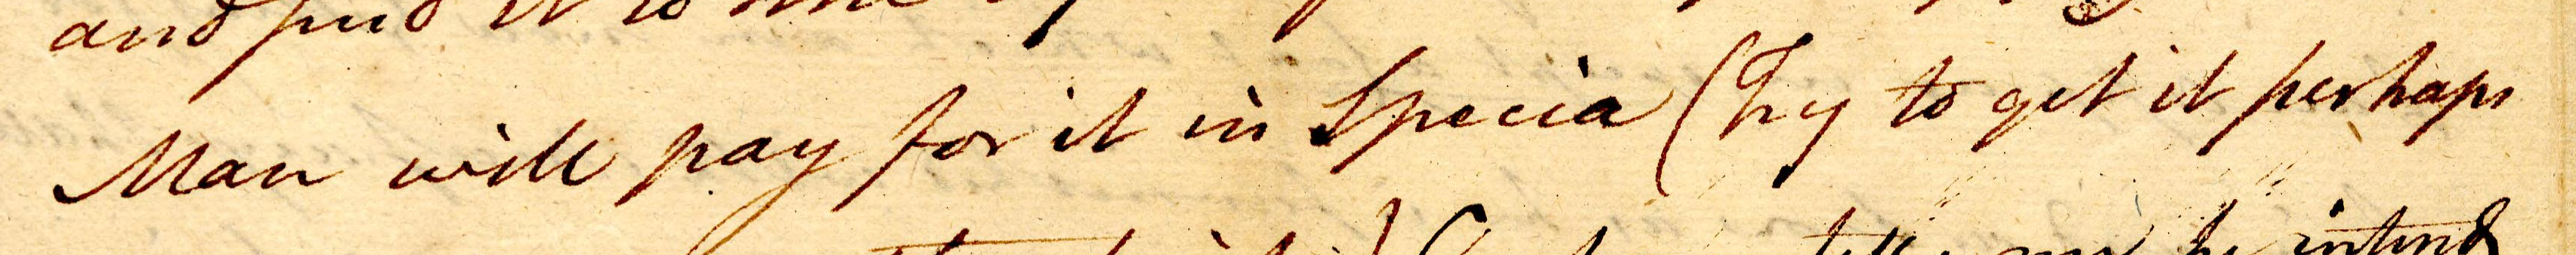Man will pay for it in specia (Try to get it perhaps
